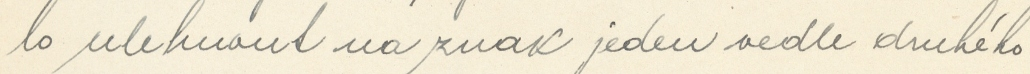lo ulehnout na znak jeden vedle druhého
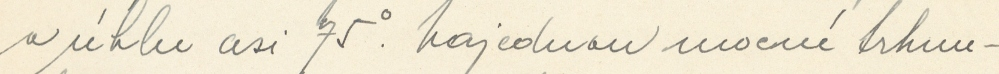v úhlu asi 75°. Najednou mocné trhnu-
